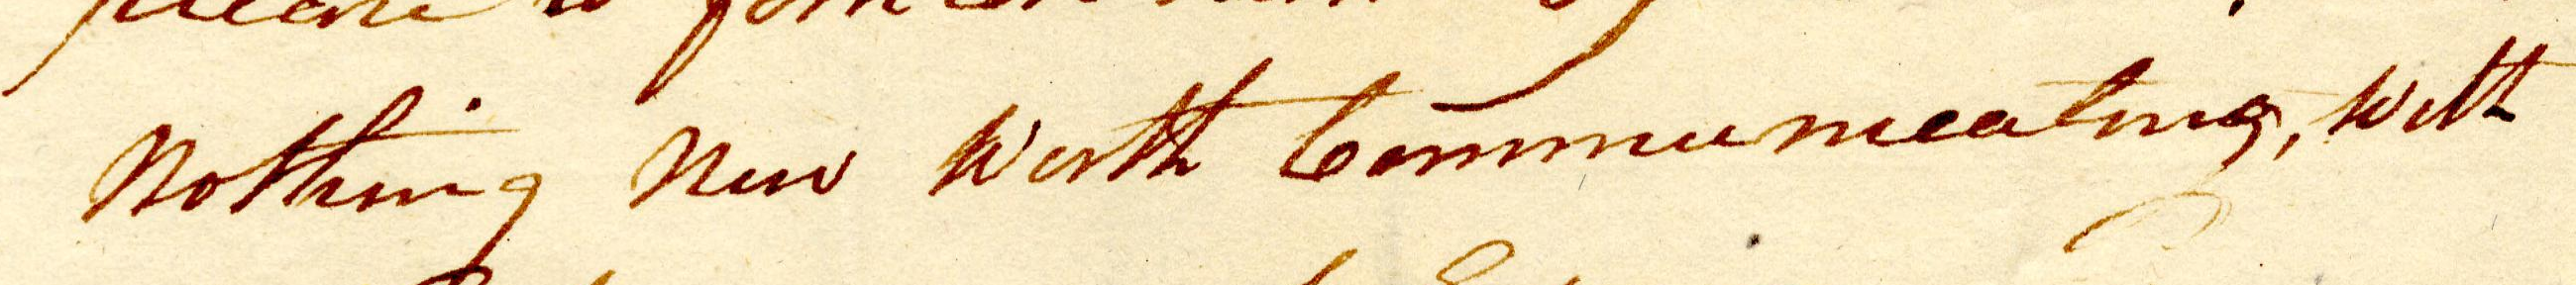Nothing new Worth Communicating, with
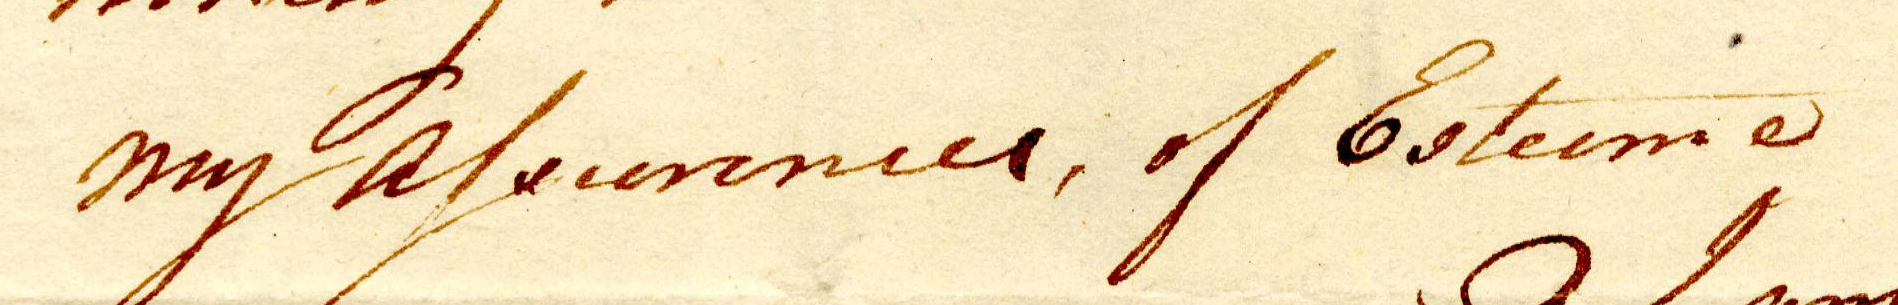my assurances, of esteeme
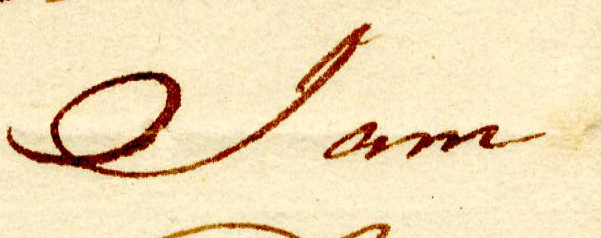I am
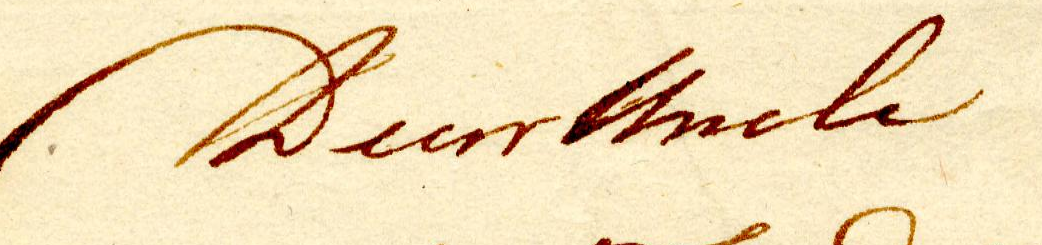Dear Uncle
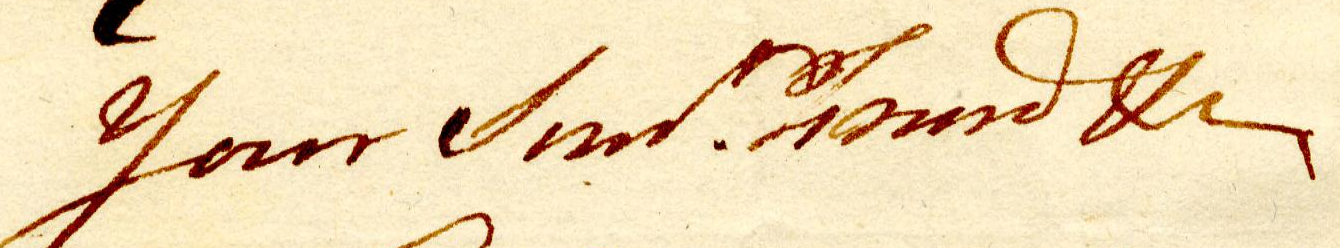Your Serv^t. Hond &
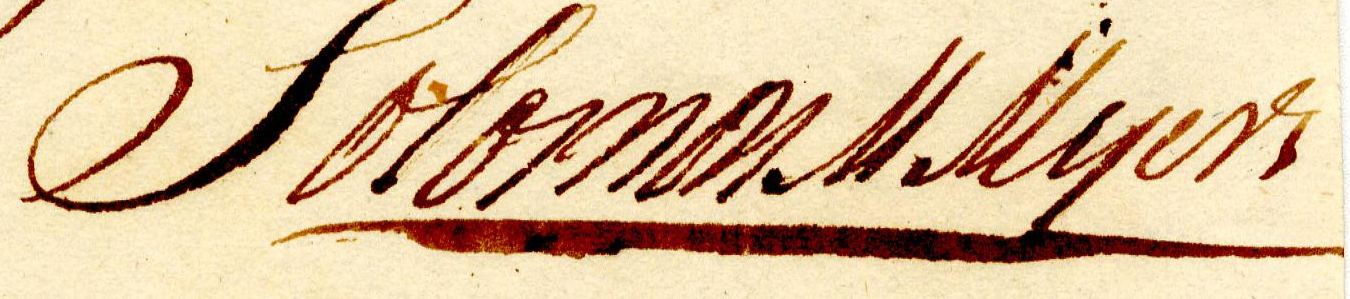Solomon M. Myers
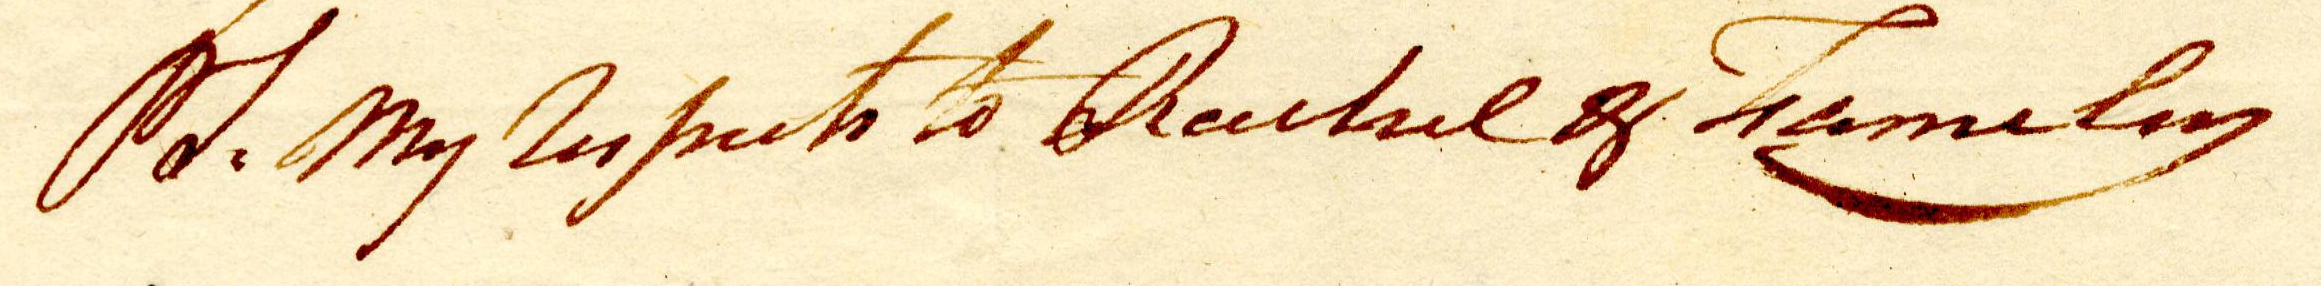PS. My respects to Rachel & Family
